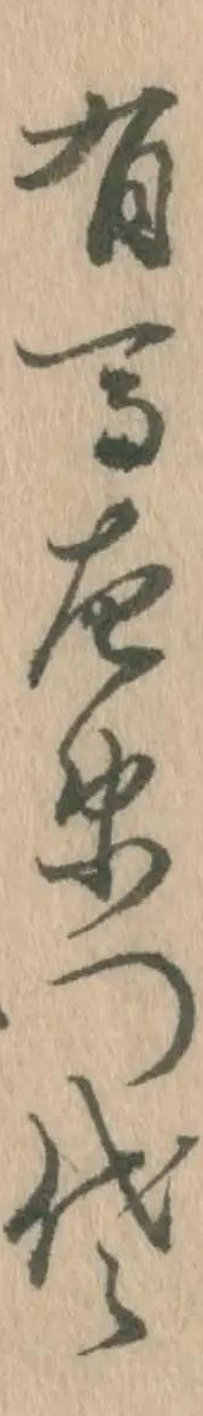有馬左衛門佐
